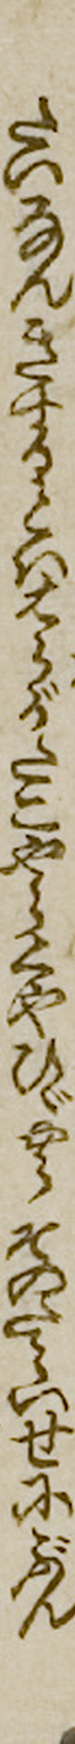たいなんぎするといはらがたこやみとやひゞやらそのたみいせにぶん
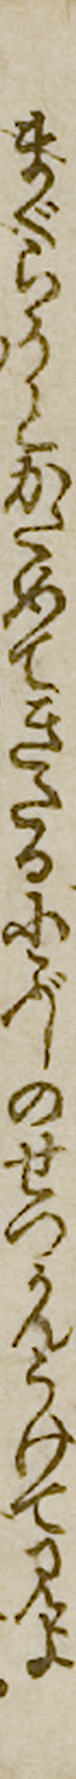まくらうとかためてきたるにぶしのせつかんうけて見よ
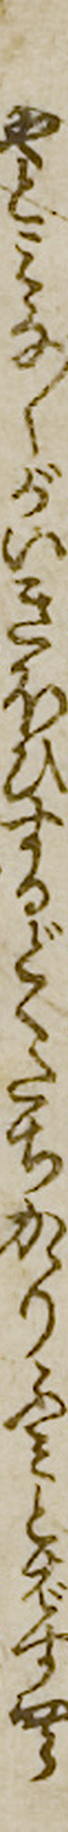やとみな〳〵がいきほひするどくたちかゝりふみとんばすやう
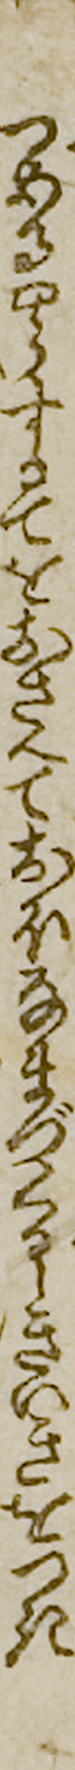つめるりするてをおさへておほなまづくるしきいきをつき
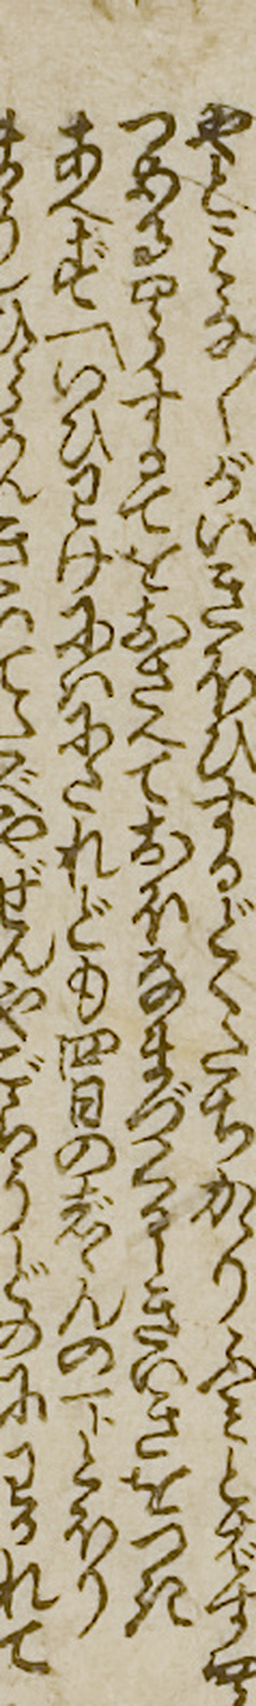つめるりするてをおさへておほなまづくるしきいきをつき
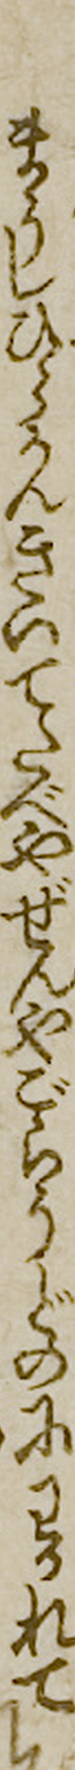まうしひらかんきいてたべやぜんやごらうどのにわかれて
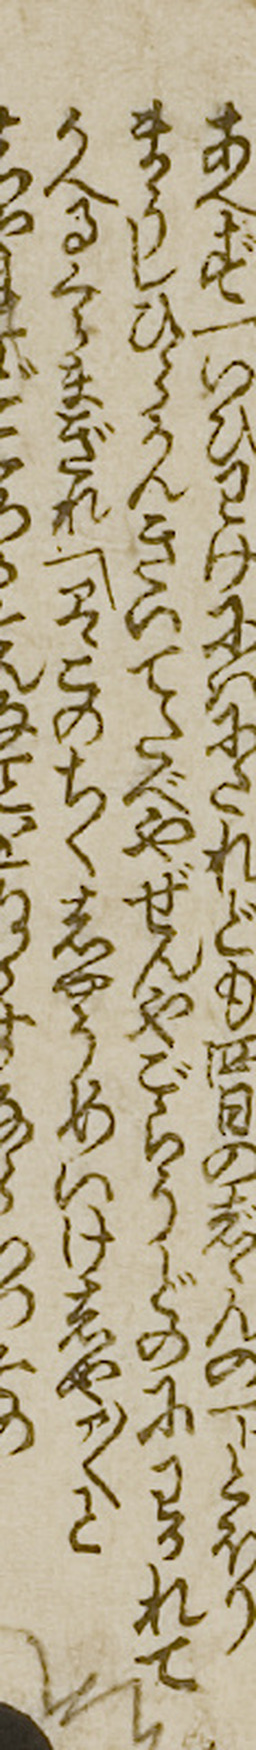まうしひらかんきいてたべやぜんやごらうどのにわかれて
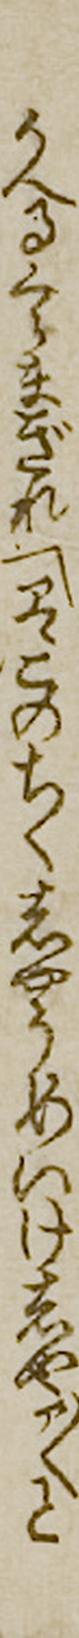かへるくみまぎれ「ゑゝこのちくしやうめいけしやあ〳〵と
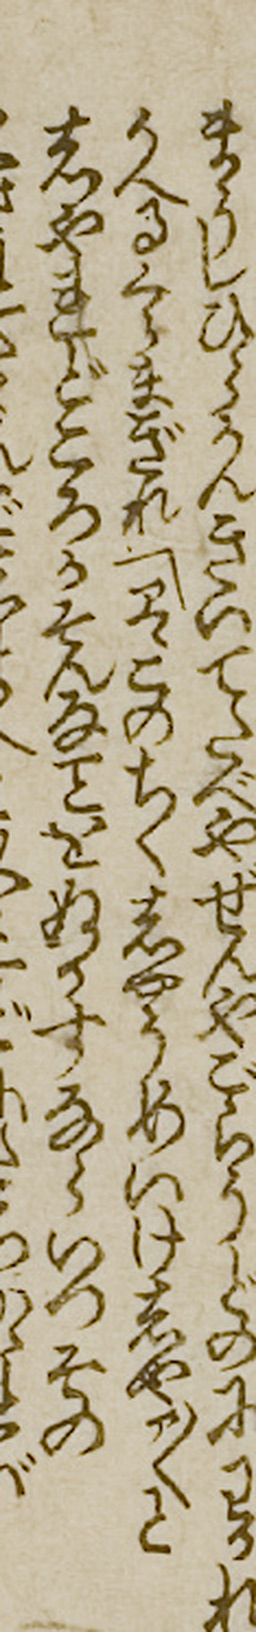かへるくみまぎれ「ゑゝこのちくしやうめいけしやあ〳〵と
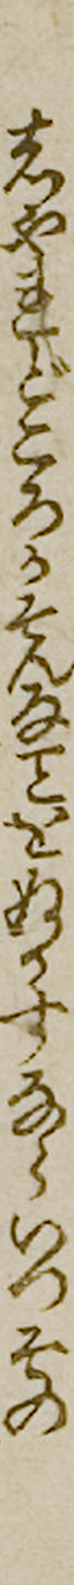しやれどころかそんなことをぬかすならいつその
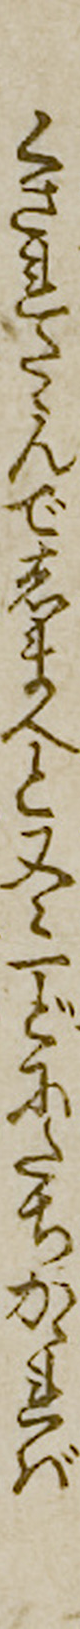くされたゝんでしまへと又々一どにたちかゝれば
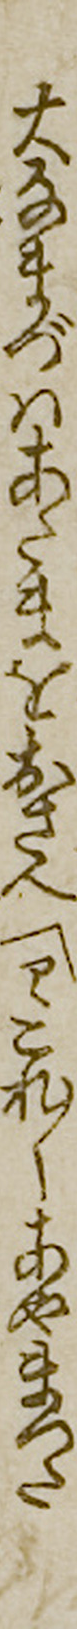大なまづはあたまをおさへ「わこれ〳〵あやまつた
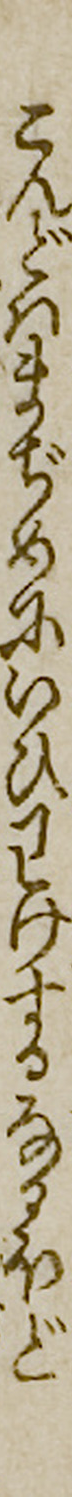こんどはまぢめにいひわけするなるほど
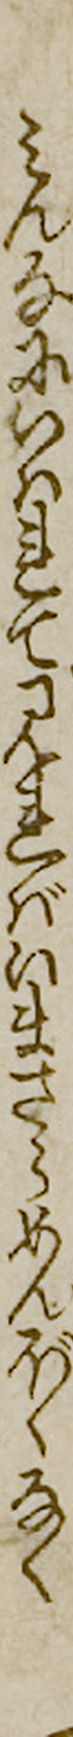みんなにいわれて見ればいまさらめんぼくなく
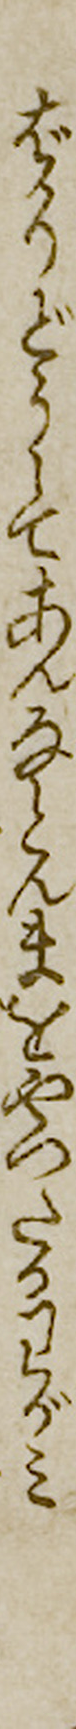ばかりどうしてあんなとんまをやつたかわがみ
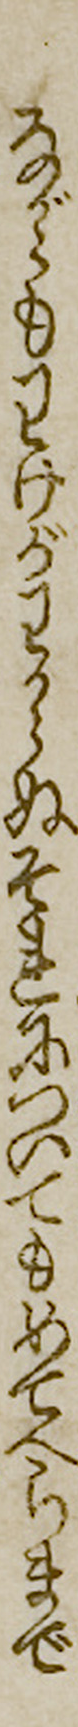ながらもわけがわからぬそれについてもめてへらまで
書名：万歳楽鯰の後悔
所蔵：東京大学総合図書館 General Library in the University of Tokyo, JAPAN
